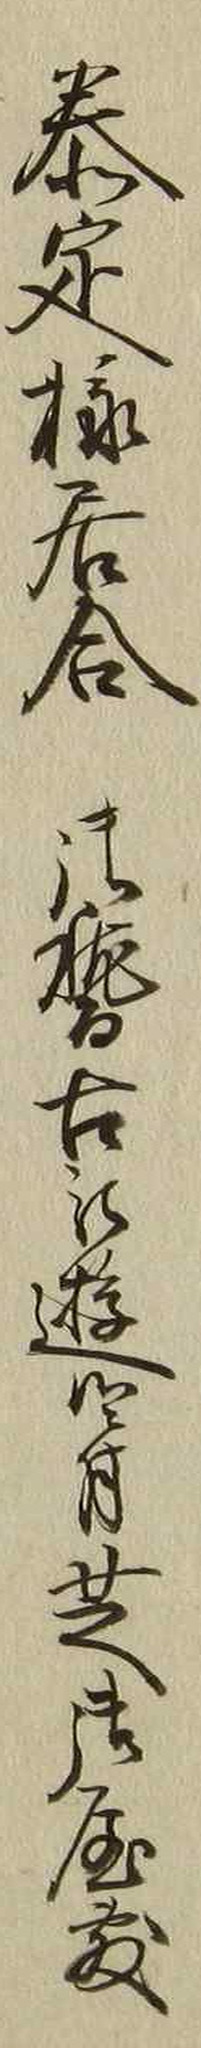恭定様居合御稽古被遊候ニ付芝御屋敷
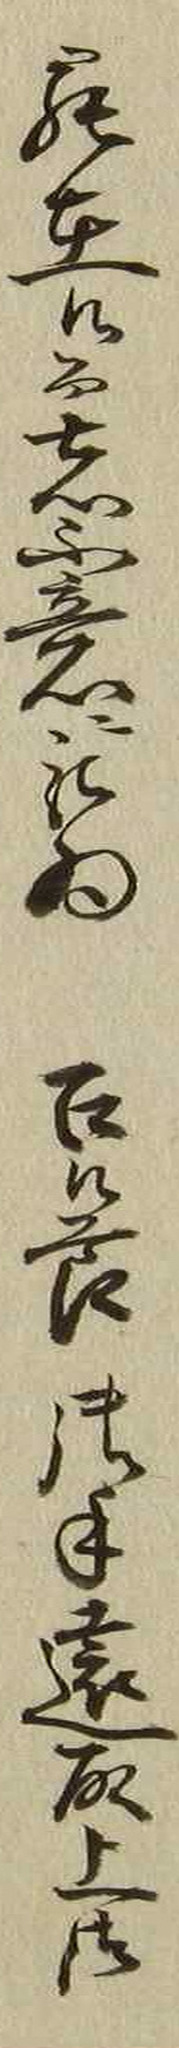罷在候而者不意ニ被為召候節御手遠故上御
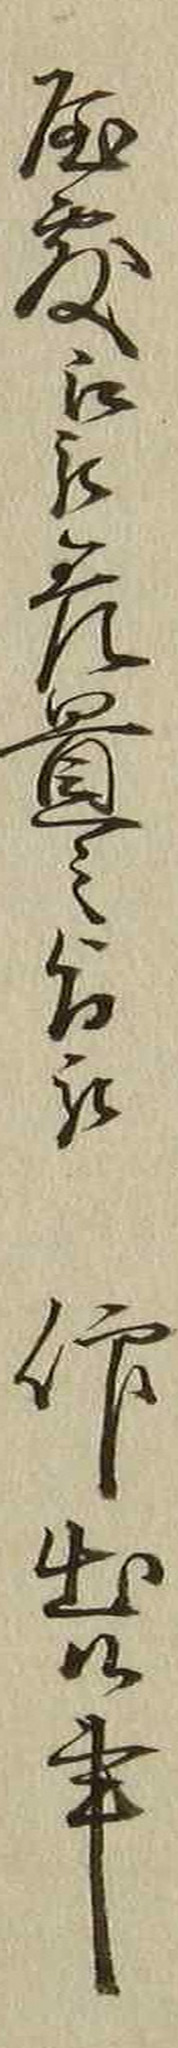屋敷江被差置之旨被仰出候事
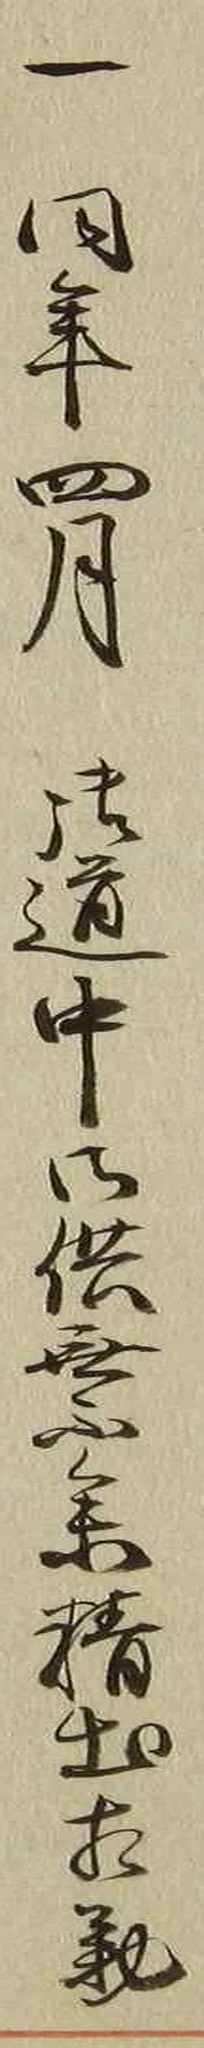一同年四月御道中御供無不参精出相勤
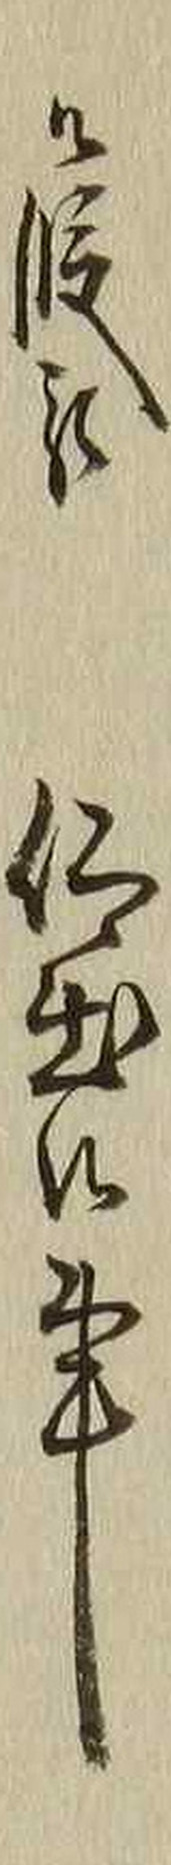候段被仰出候事
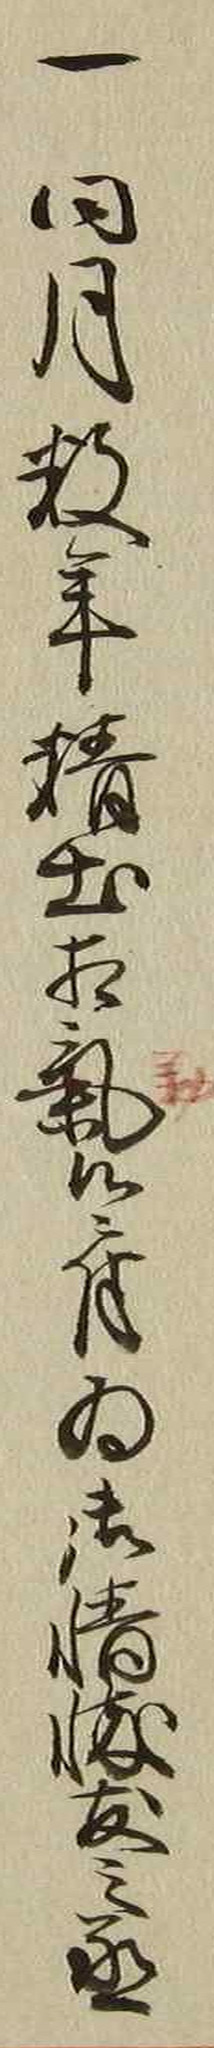一同月数年精出相勤候ニ付為御情忰友之丞
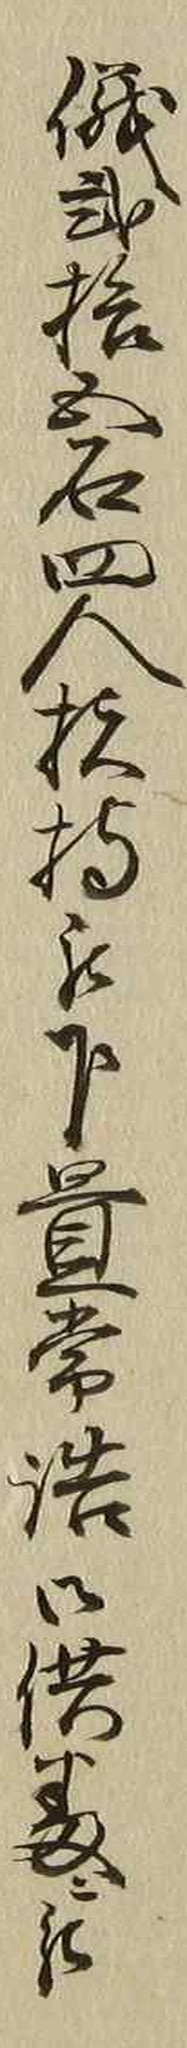儀弐拾五石四人扶持被下置常詰御供番ニ被
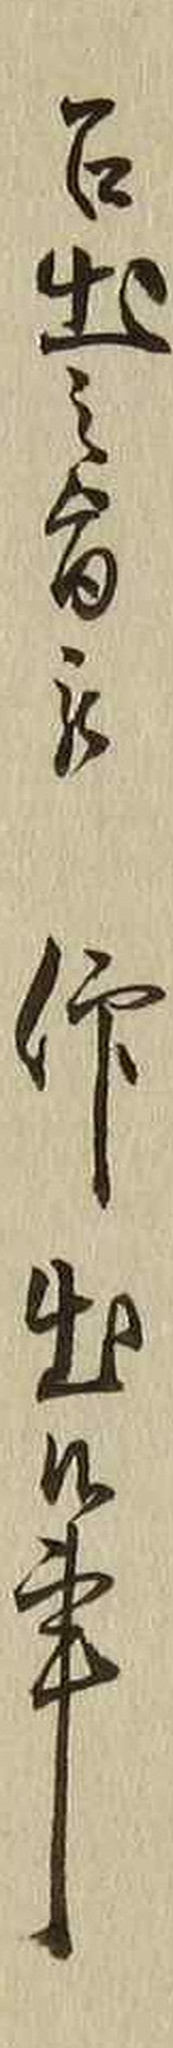召出之旨被仰出候事
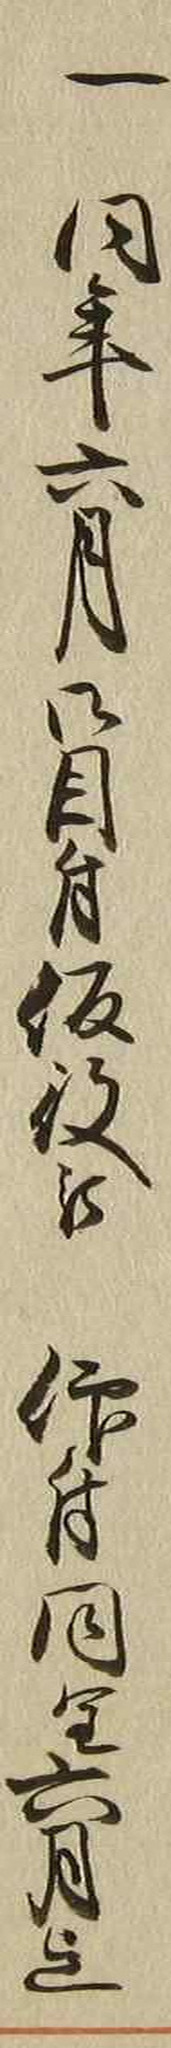一同年六月御目付仮役被仰付同閏六月迄
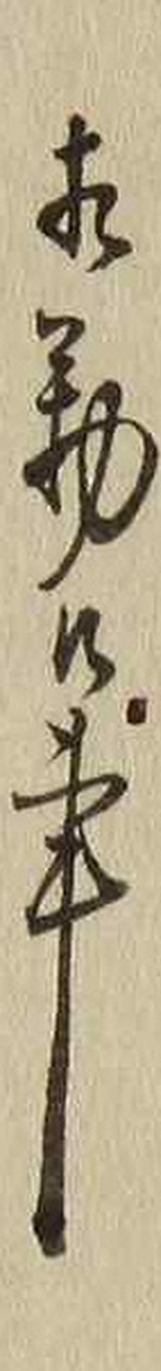相勤候事
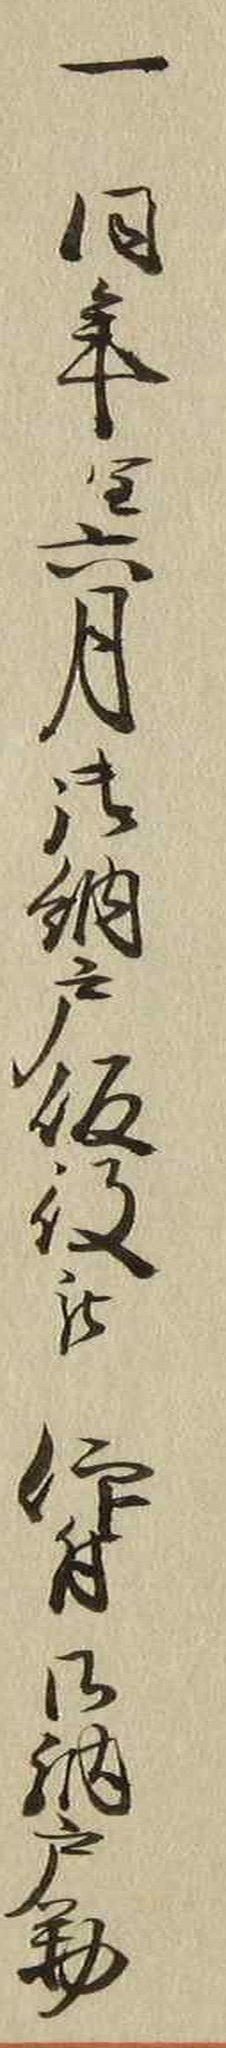一同年閏六月御納戸仮役被仰付御納戸勤
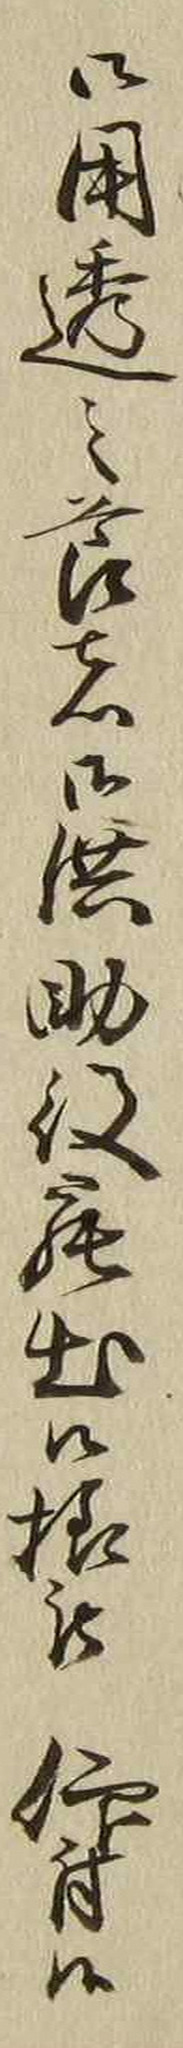御用透之節者御供助役罷出候様被仰付候
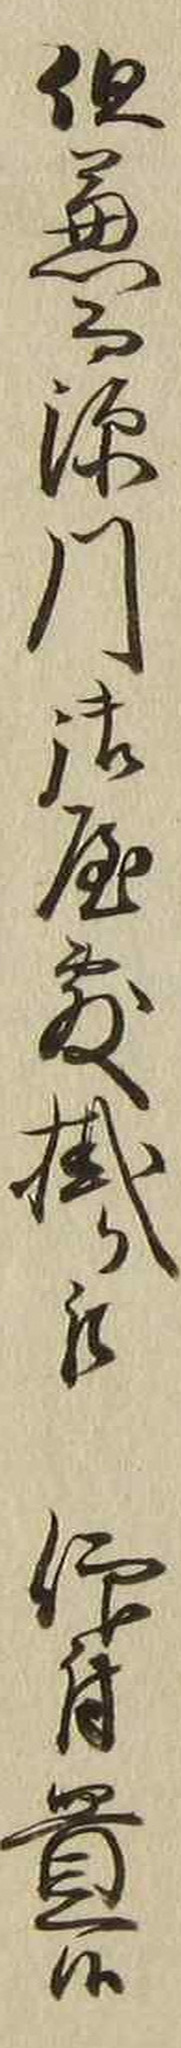但兼而深川御屋敷掛り被仰付置候
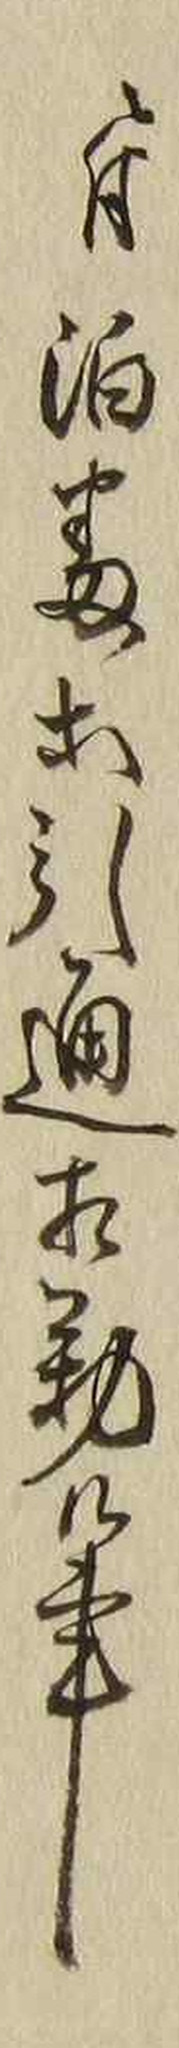ニ付泊番等引通相勤候事
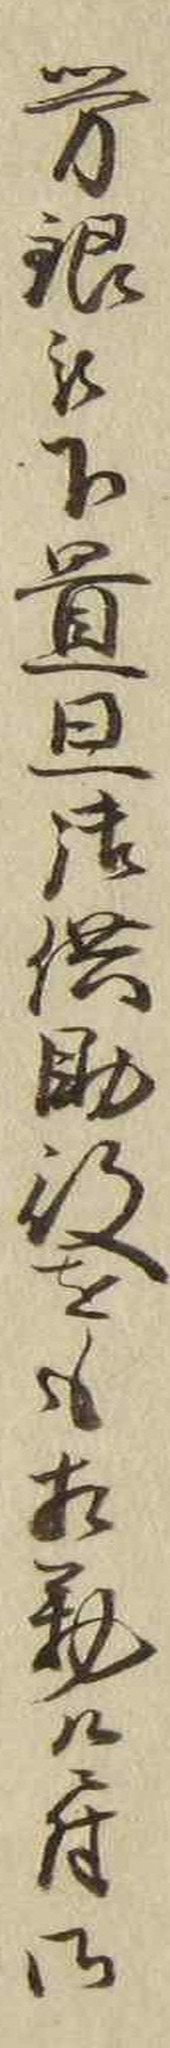労銀被下置且御供助役をも相勤候ニ付御
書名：諸士系譜　巻之67　を之部1
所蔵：会津若松市立会津図書館
